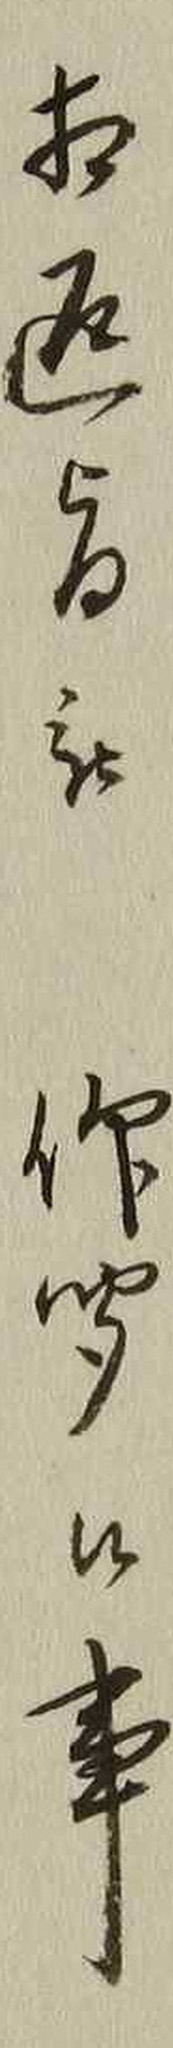相返旨被仰聞候事
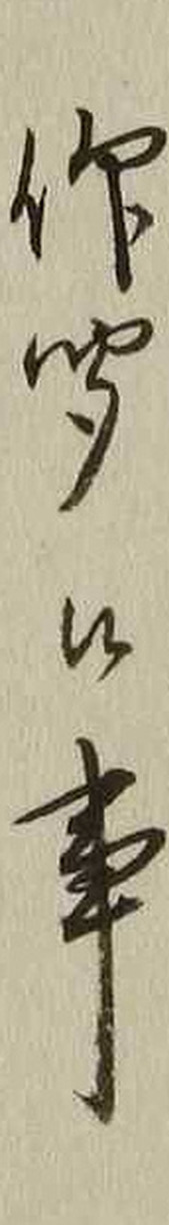仰出候事
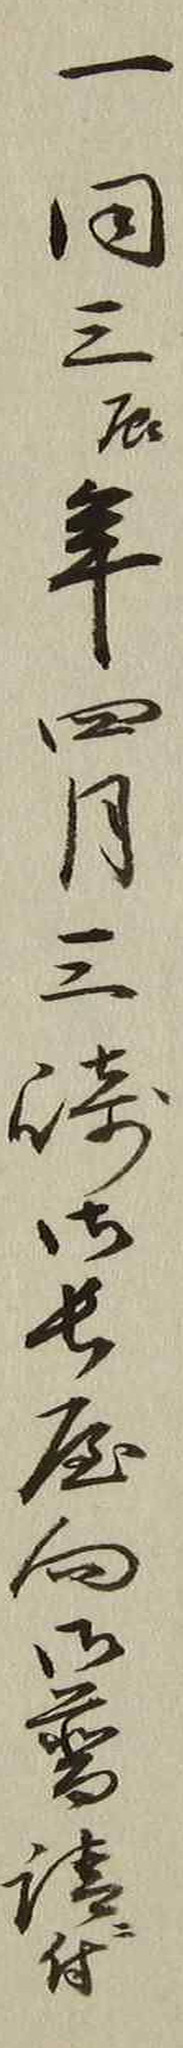一同三辰年四月三崎御長屋向御普請ニ付
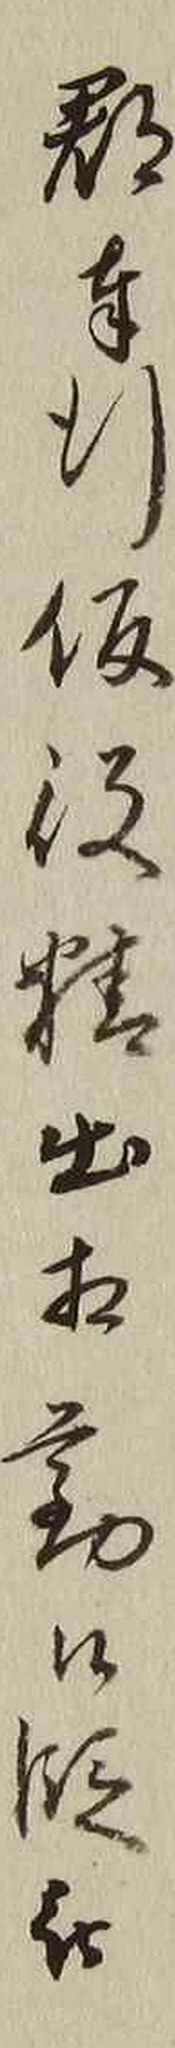郡奉行仮役精出相勤候段被
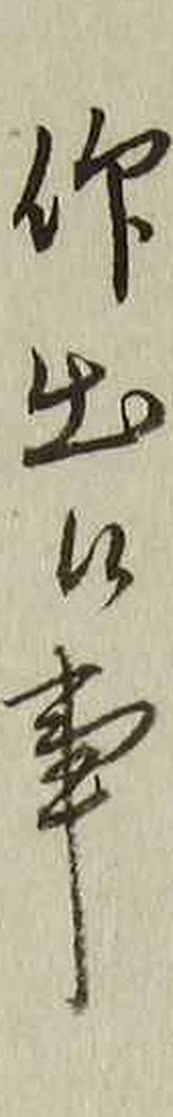仰出候事
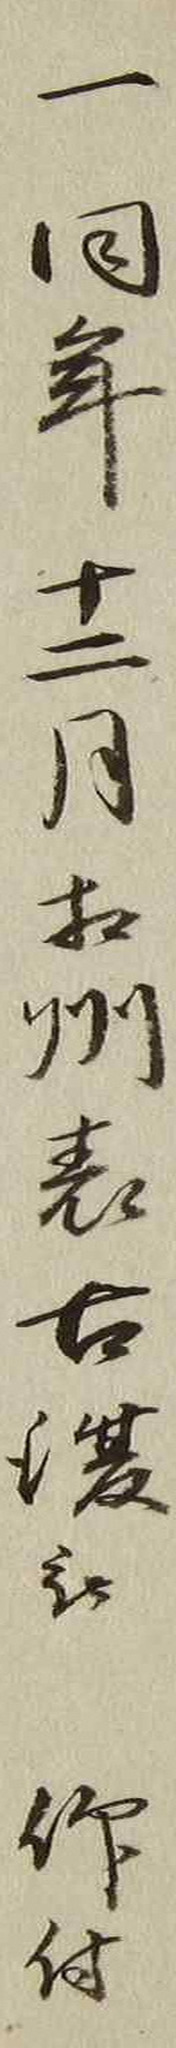一同年十二月相州表古復被仰付
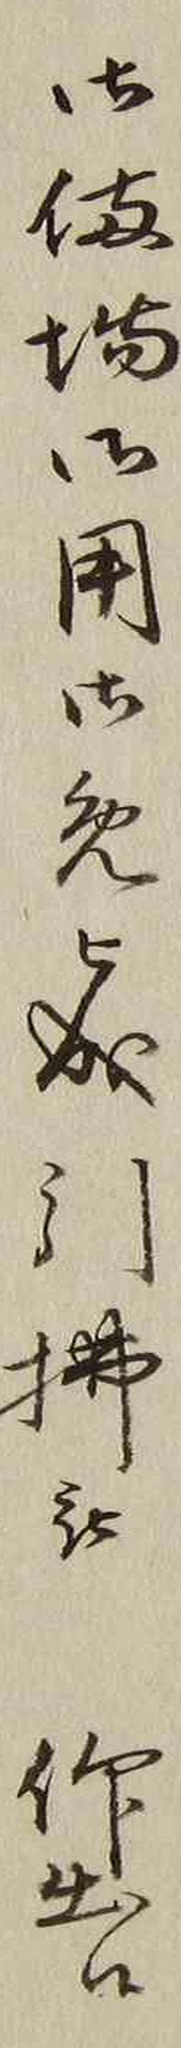御備場御用御免被成引払被仰出候
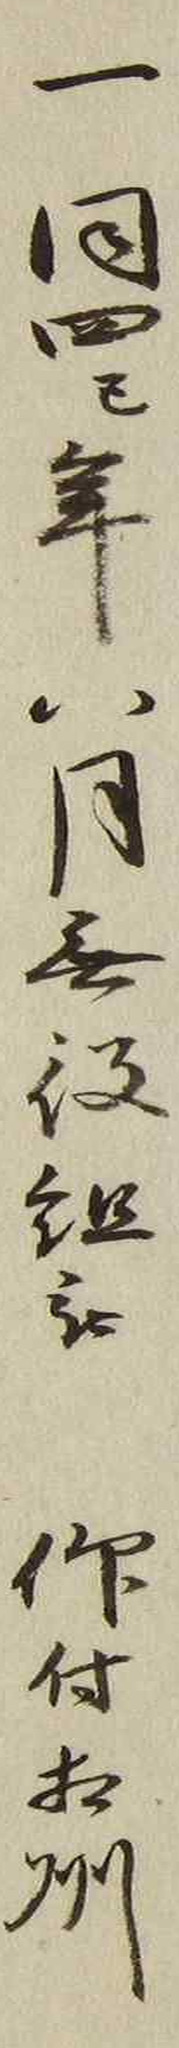一同四巳年八月無役組被仰付相州
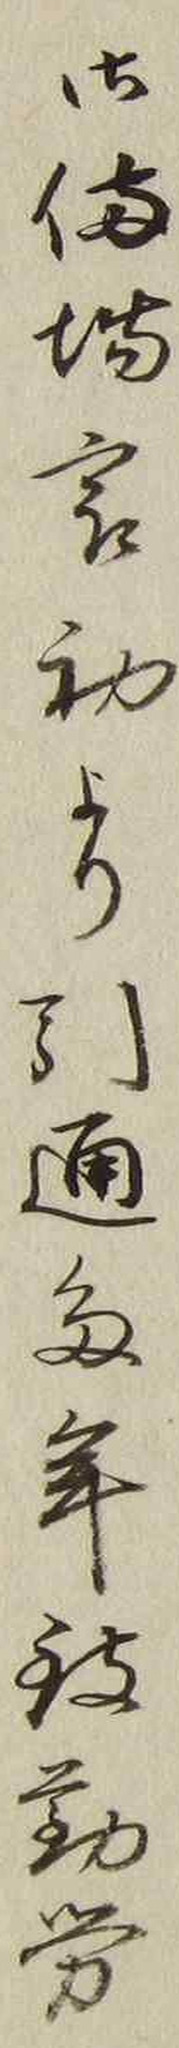御備場最初より引通多年致勤労
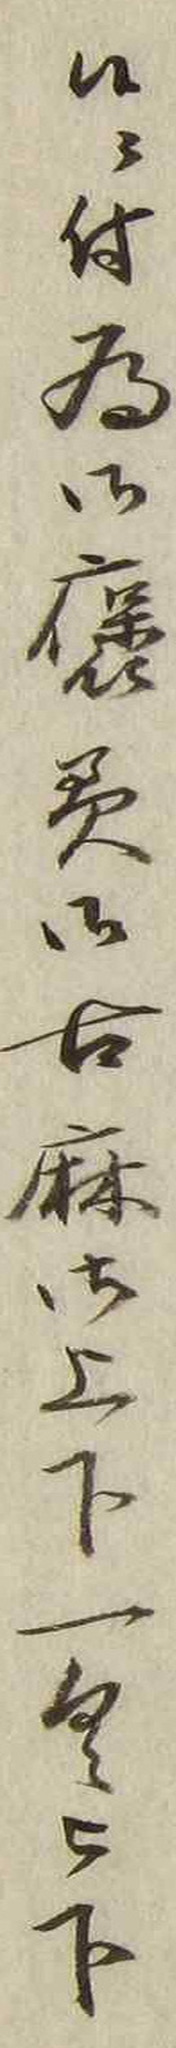候ニ付為御褒美御古麻御上下一具被下

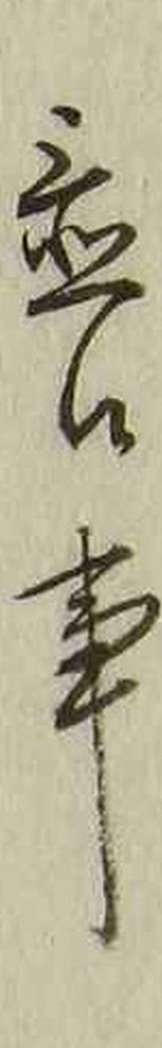置候事
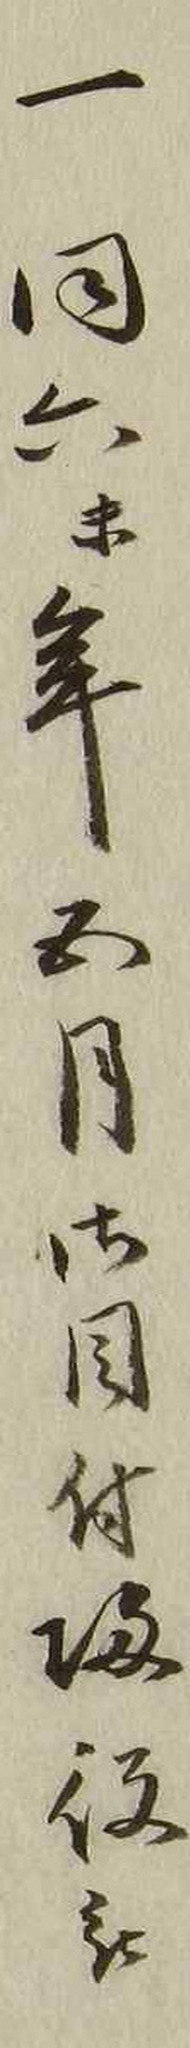一同六未年五月御目付帰役被
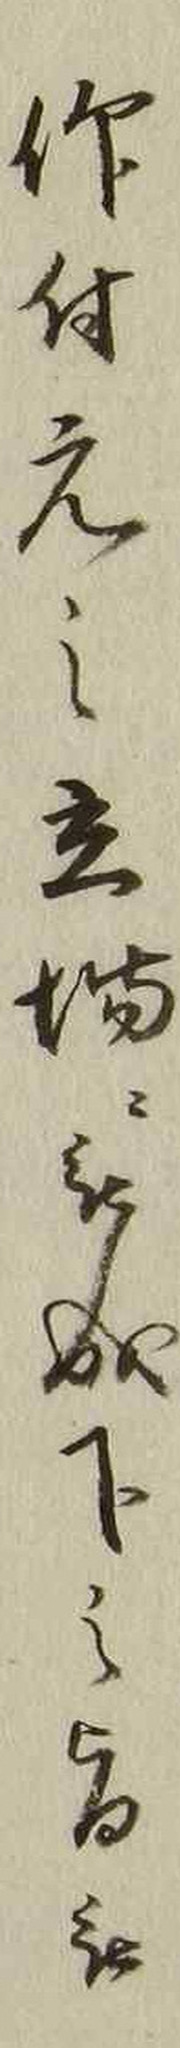仰付元之立場ニ被成下之旨被
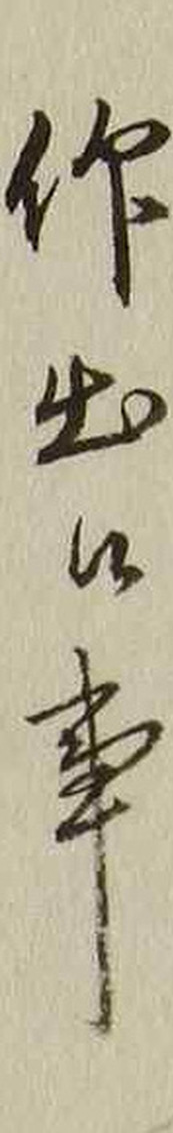仰出候事
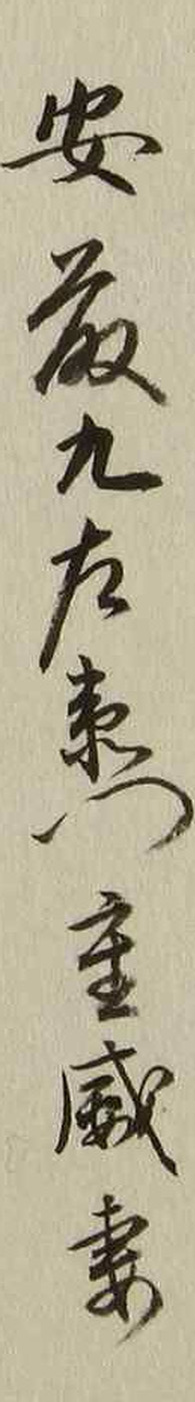女安藤九左衛門重威妻
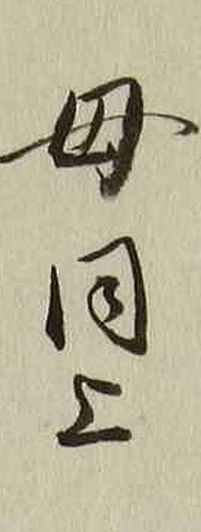母同上
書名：諸士系譜　巻之128　た之部4
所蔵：会津若松市立会津図書館
